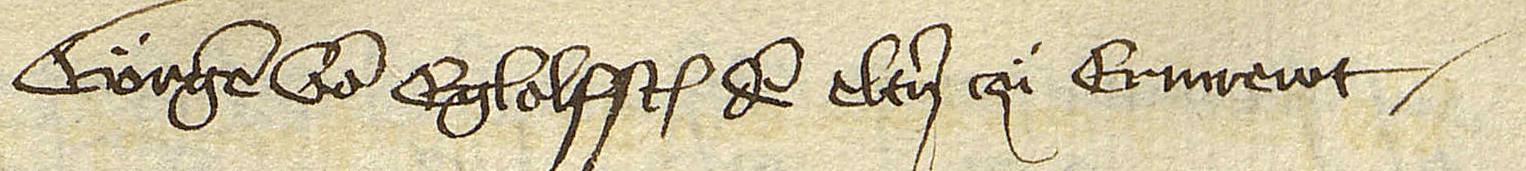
Görge* vo* Eglolfſt* d* eltn* cʒü Ermrewt /
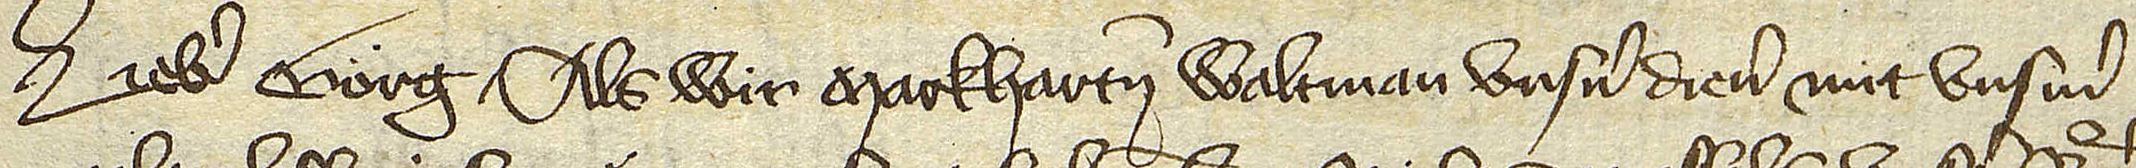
Lieb* Görg / Als wir Markhartn* Waltman vnſn* dien* mit vnſm*
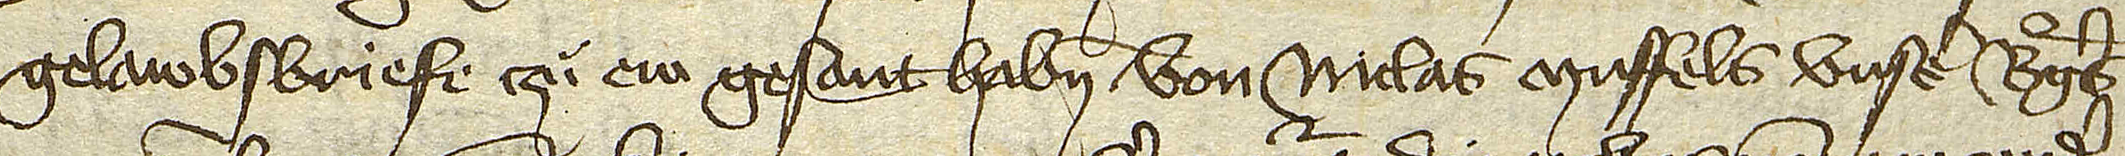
gelawbſbriefe cʒü ew geſant habn* / von Niclas Muffels vnſs* B*g*s
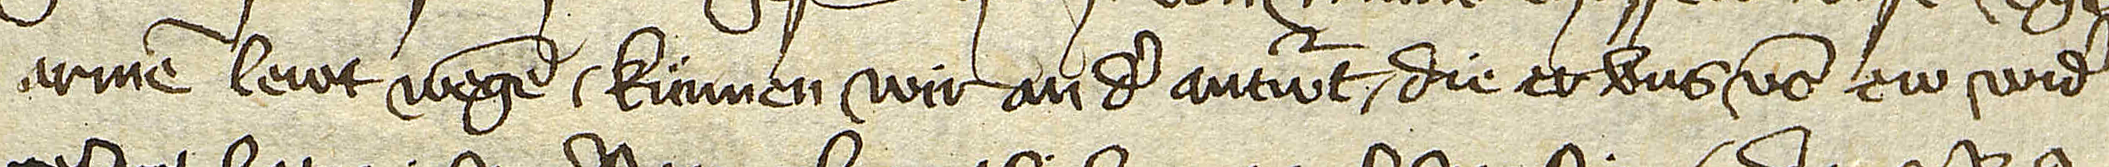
arme* lewt wege* / künnen wir an d* antw*t / die er vns vo* ew wid*
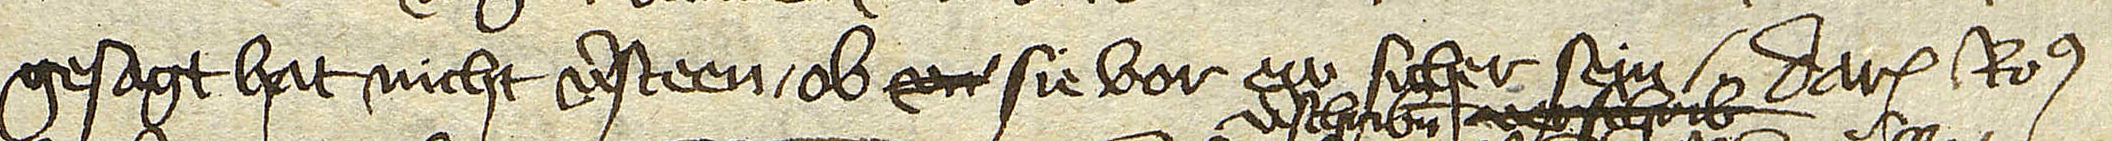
geſagt hat nicht v*ſteen / ob vn ſie vor ew ſicher ſein / Dar* Ro*
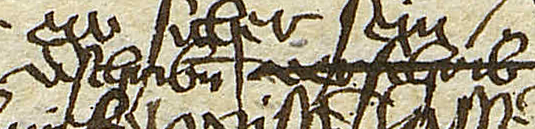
v*ſchribn* verſchrib
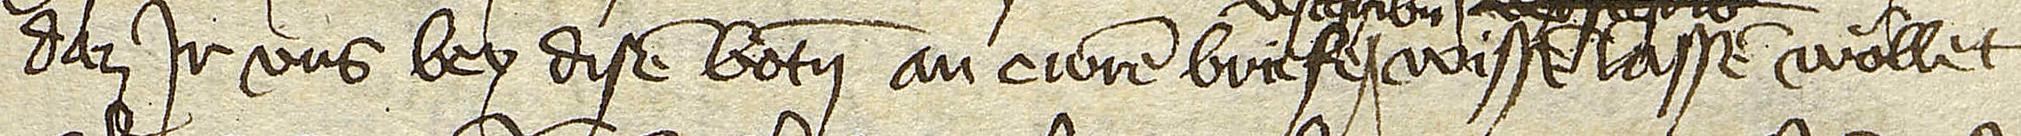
daʒ Ir vns bey diſe* botn* an ewre* briefe wiſſe* laſſe* wöllet
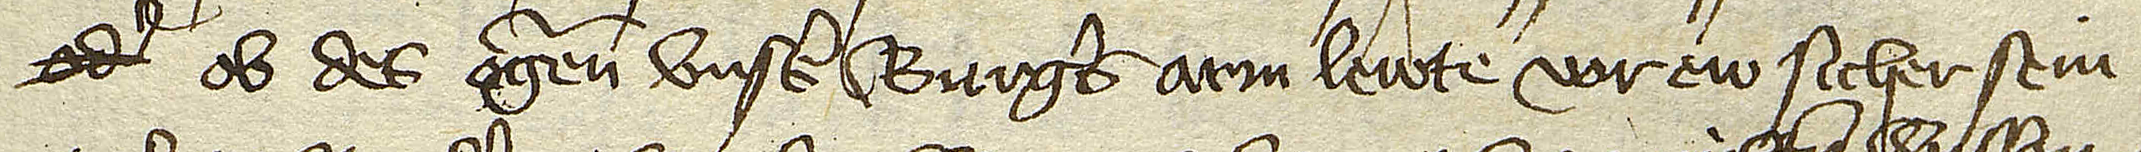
od* ob des egen* vnſs* Burg*s arm lewte vor ew ſicher ſein
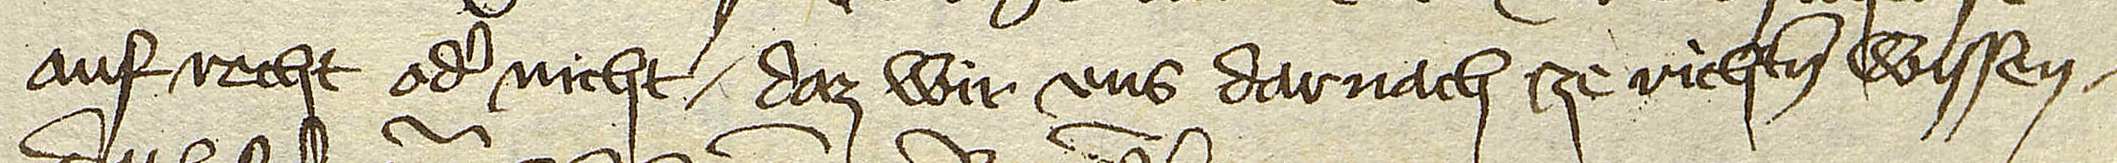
auf recht od* nicht / daʒ wir vns darnach cʒe richtn* wiſſen /
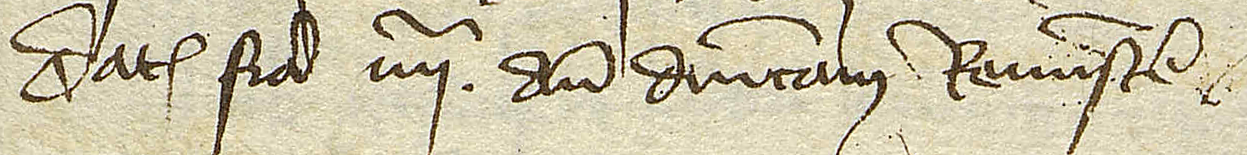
Dat* fia* iiii*. An* dnicam* Remiſce* /
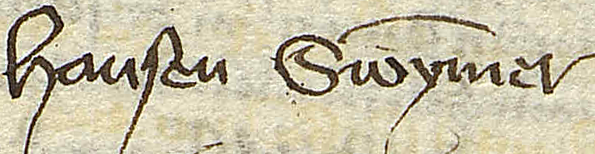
hanſen Swymer*
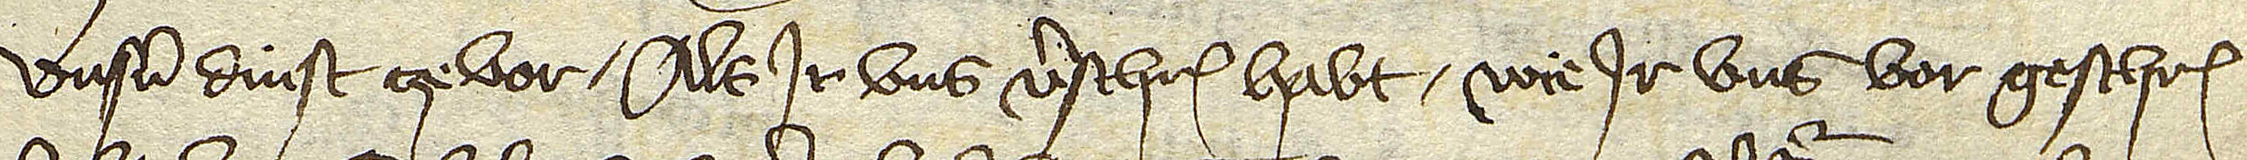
Vnſn* dinſt cʒevor / Als Ir vns v*ſchr* habt / wie Ir vns vor geſchr*
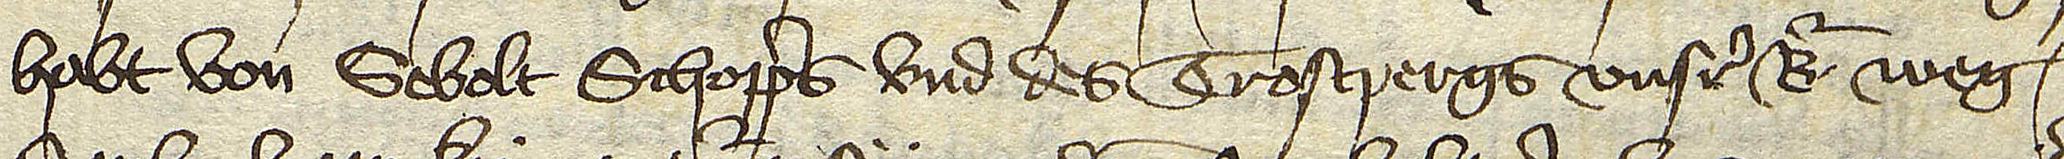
habt von Sebolt Schopp*s vnd des Troſtpergs vnſr* B* weg*
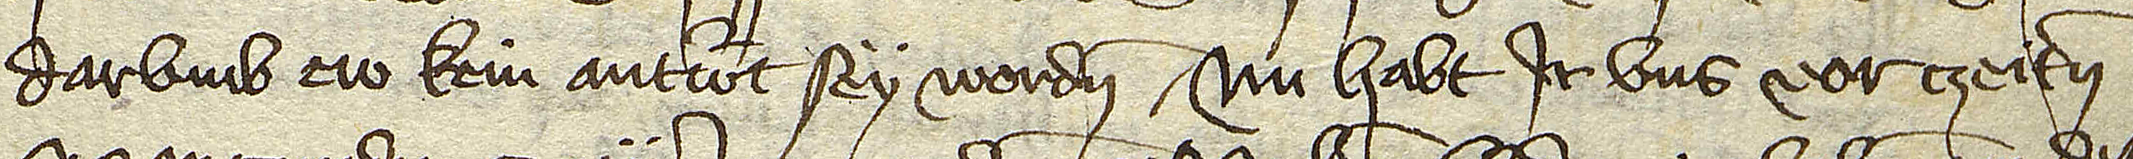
darvmb ew kein antw*t ſey wordn* / Nu habt Ir vns vor cʒeitn*
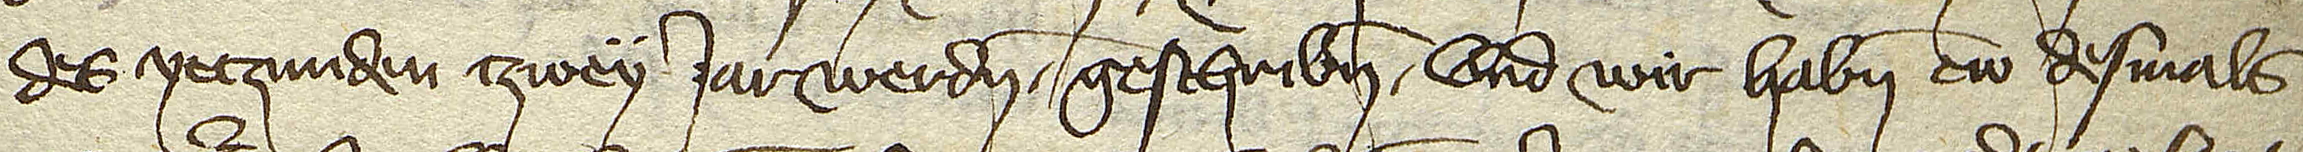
des yecʒunden cʒwey Iar werdn* / geſchribn* / vnd wir habn* ew deſmals
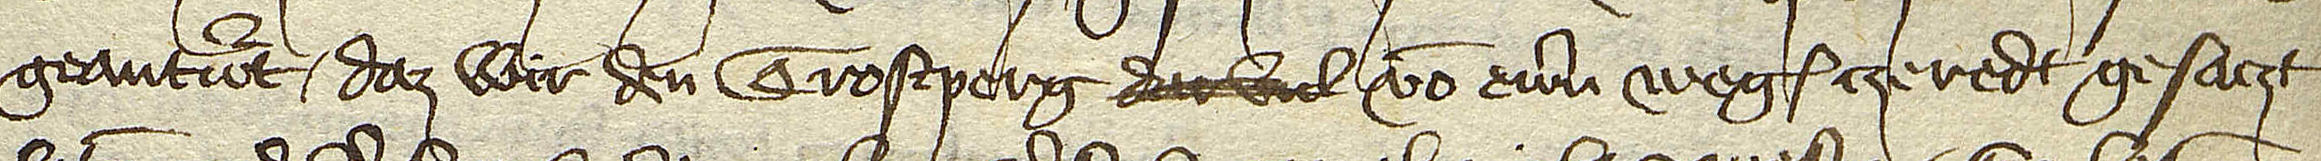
geantw*t / daʒ wir den Troſtperg darvnb vo* ewn* weg* cʒeredt geſacʒt
